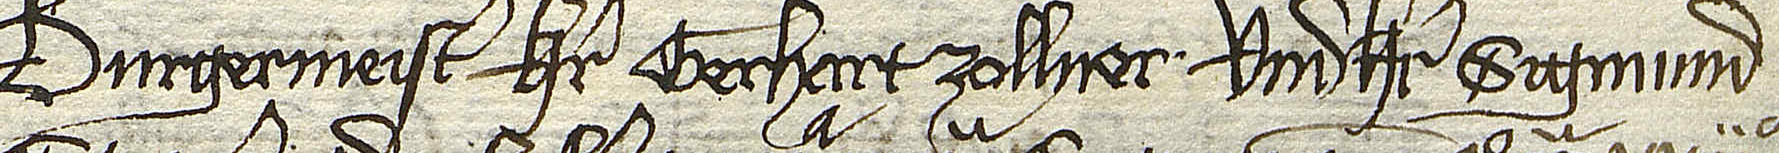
Burgermeiſt* H*r Gerhart ʒollner . Vnd H*r Sigmund
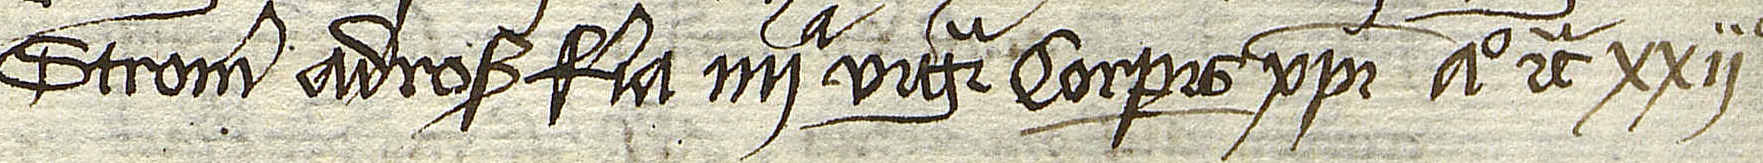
Strom* adroſ* fia* iiii* vigi* Corp*is xpi* a* ec* xxii*
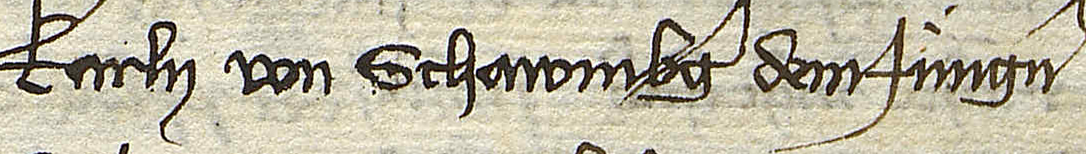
Karln von Schawmb*g dem Iüng*n
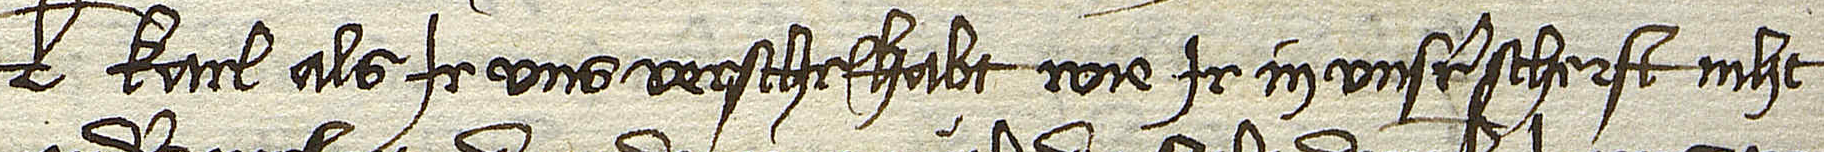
L* karl als Ir vns verſchr* habt wie Ir in vnſ*r ſchrift niht
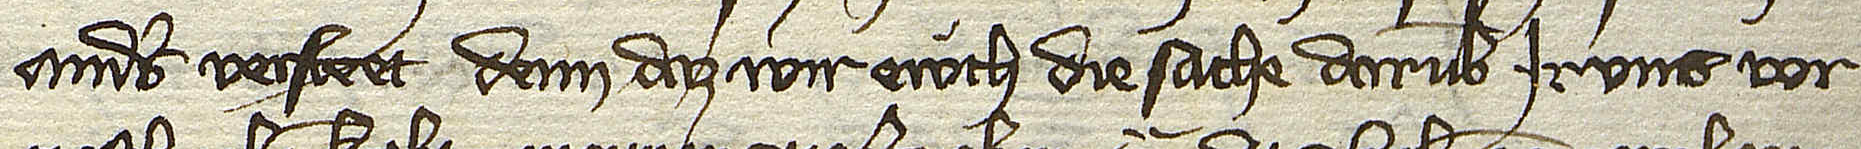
and*s verſteet denn daʒ wir ewch die ſache daru*b Ir vns vor
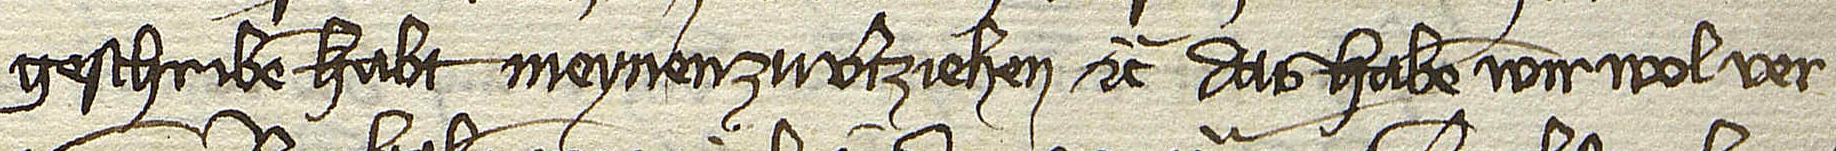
geſchribe* habt meynen ʒu v*cʒiehen / ec* das habe* wir wol ver -
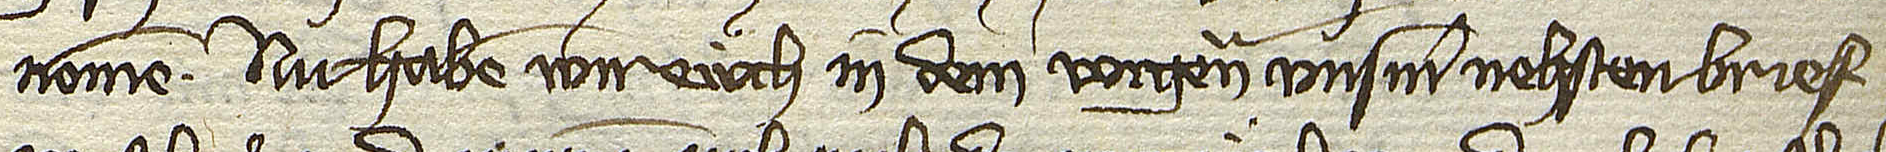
nome* . Nu habe* wir ewch in dem vorgen* vnſ*m nehſten brief
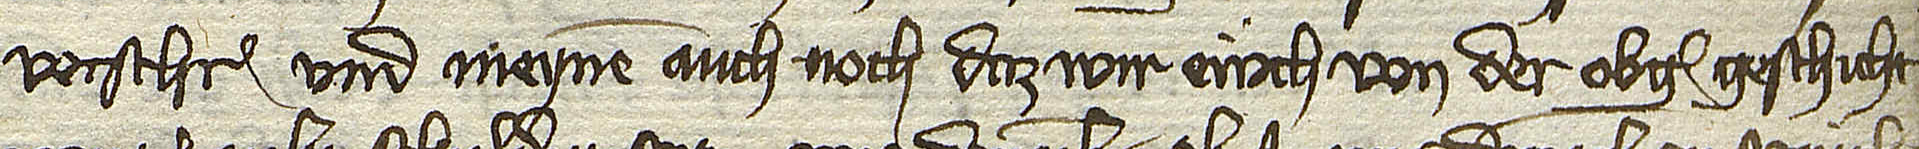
verſchr* vnd meyne* auch noch daʒ wir ewch von der obg* geſchicht
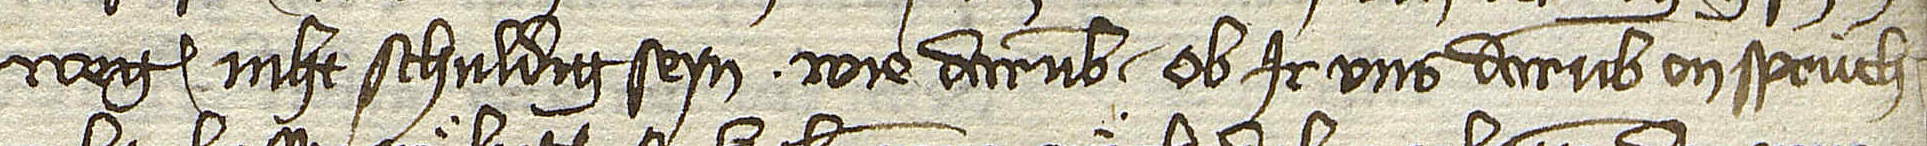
weg* niht ſchuldig ſeyn . wie daru*b / ob Ir vns daru*b on ſprüch
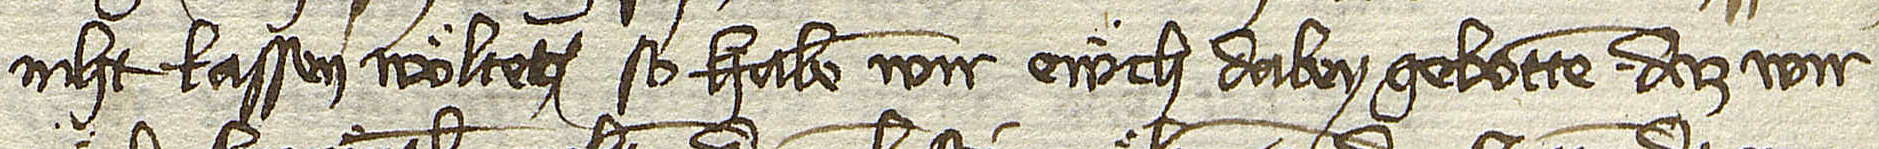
niht laſſen wöltet ſo habe* wir ewch dabey gebotte* . daʒ wir
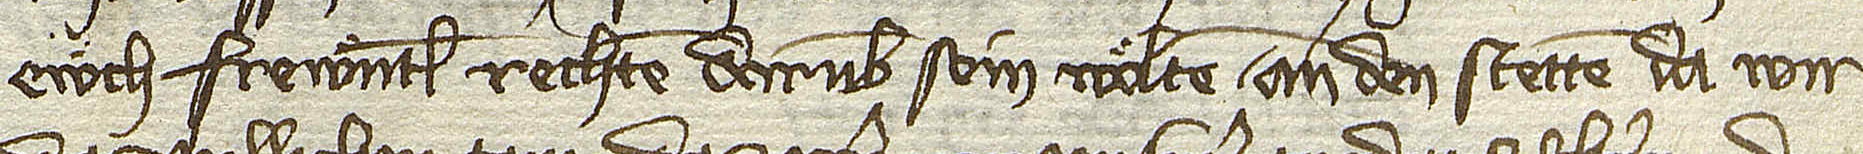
ewch frewntl* rechte* daru*b ſein wölte* / an den ſtette* da wir
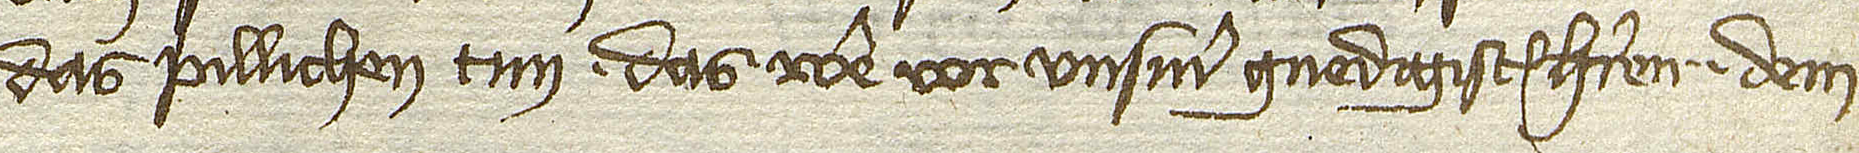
das pillichen tun . Das we* vor vnſ*m gnedigiſt* h*ren ~ dem
